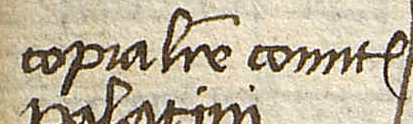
copia lre* comit*
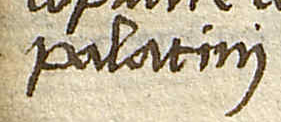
palatini
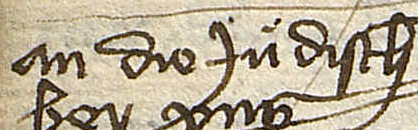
an die Iüdiſch*
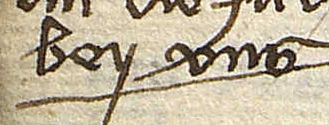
bey vns
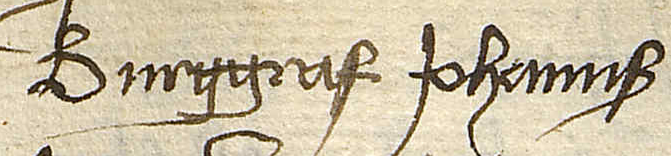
Burggraf Iohannſ*
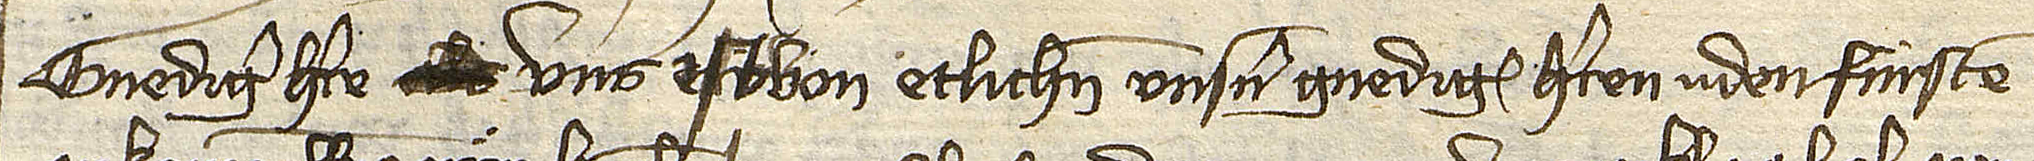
Gnedig* h*re als Vns iſt etwvon etlichn* vnſn* gnedig* h*ren ~ den fürſte*
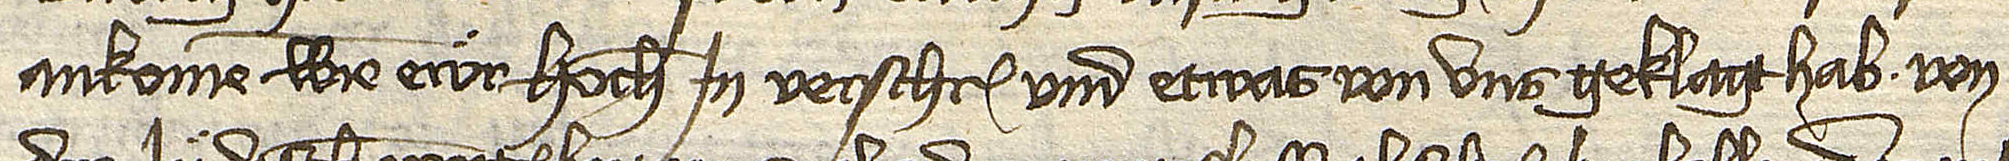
ankome* Wie eẅr hoch* In verſchr* vnd etwas von Vns geklagt hab . von
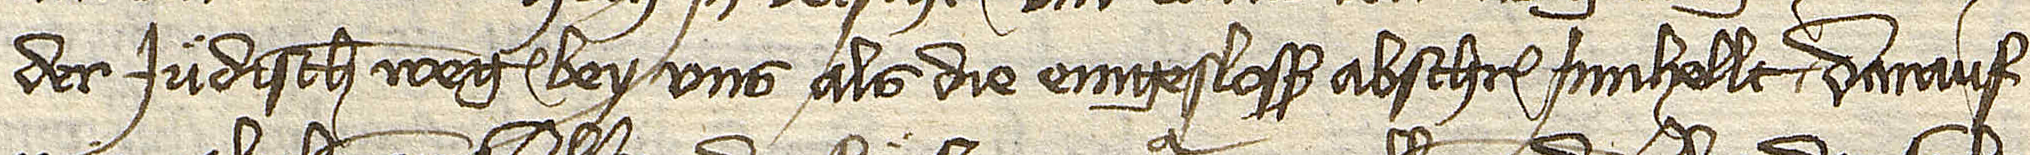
der Iüdiſch* weg* bey vns als die eingeſloſſ* abſchr* Innhellt / Darauf
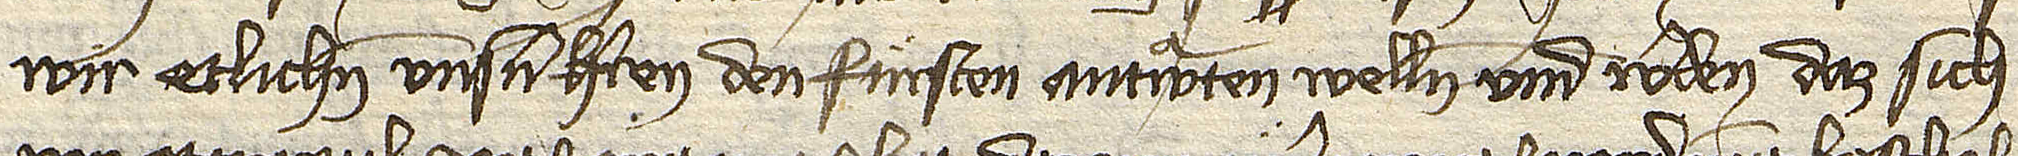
wir etlichn* vnſn* h*ren den fürſten antw*ten welln* vnd w*den daʒ ſich
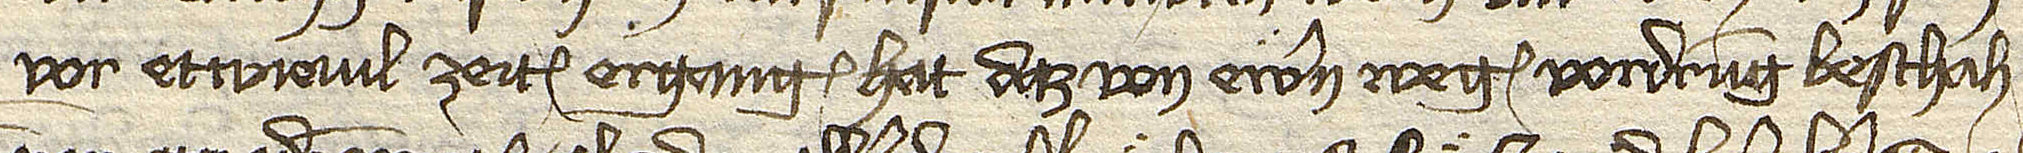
vor etwieuil ʒeit* ergang* hat daʒ von eẅ*n weg* vordru*g beſchah
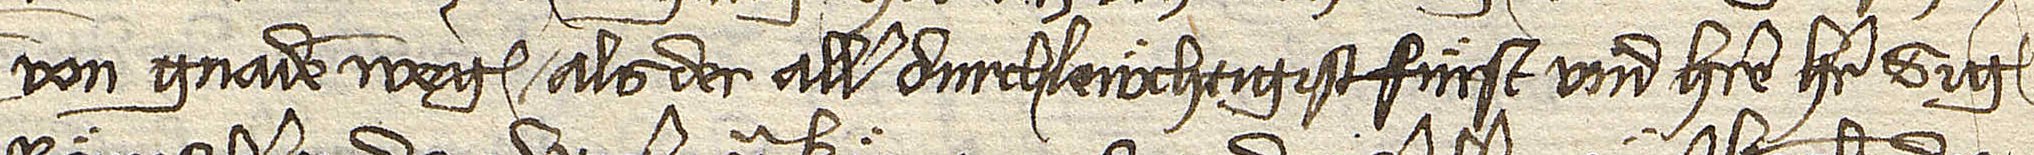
von gnade* weg* / als der all* durchleẅchtigiſt fürſt vnd h*re hr* Sig*
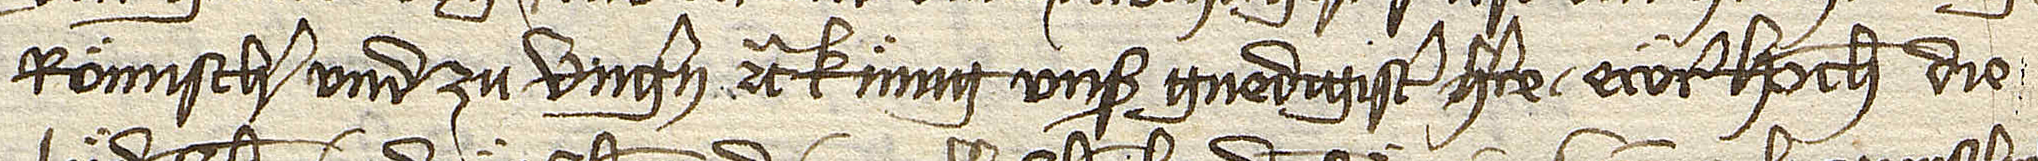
Römiſch* vnd ʒu Vng*n ec* künig vnſ* gnedigiſt* h*re / eẅr* hoch* die
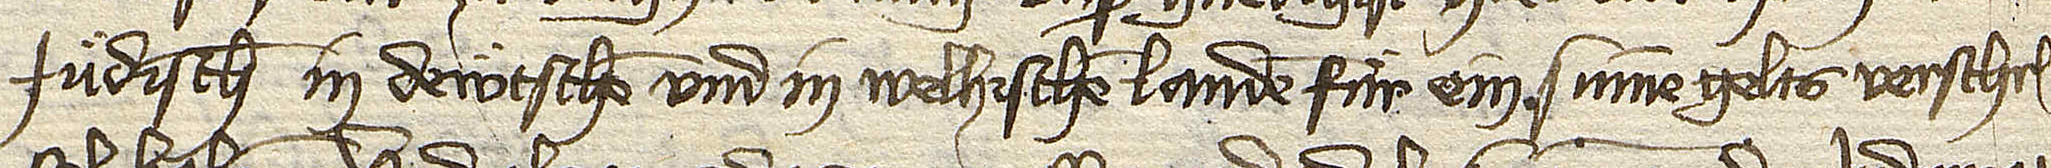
Iüdiſch* in deẅtſche* vnd in welhiſche* lande für ein ſum*e gelts verſchr*
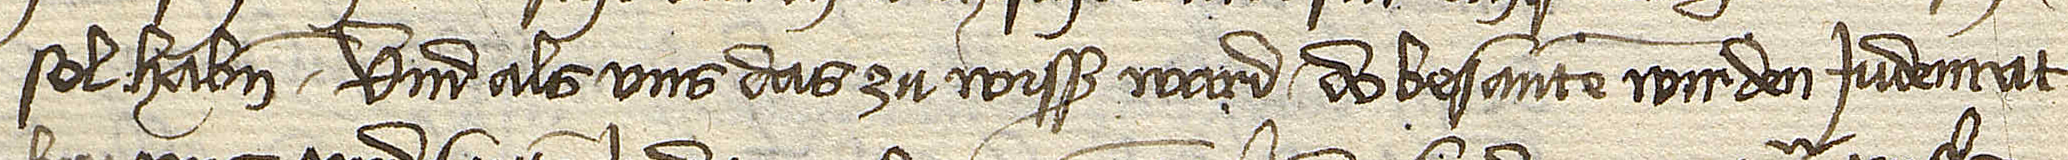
ſol habn* / Vnd als vns das ʒu wiſſ* ward / do beſante* wir den Iudenrat
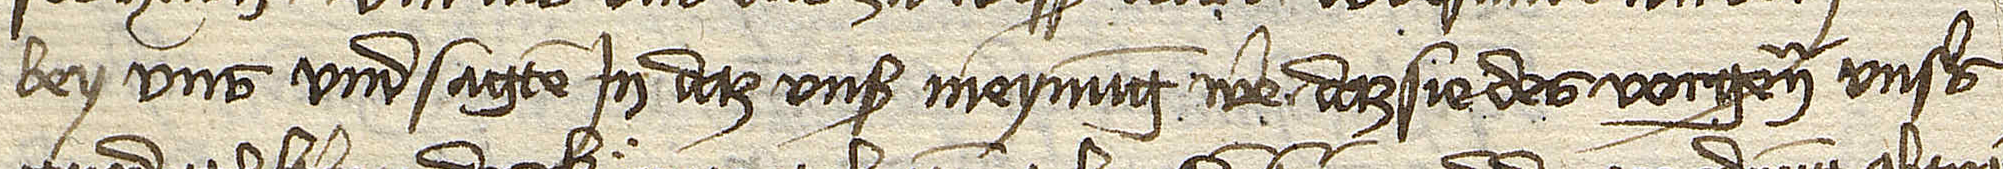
bey vns vnd ſagte* In daʒ vnſ* meynu*g w*e / daʒ ſie des vorgen* vnſ*s
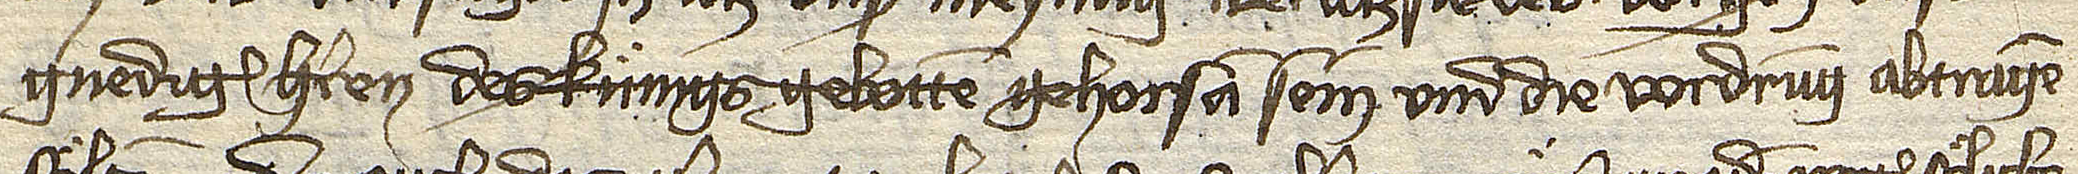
gnedig* h*ren des künigs gebotte* gehorſa* ſein vnd die vordru*g abtrage*
